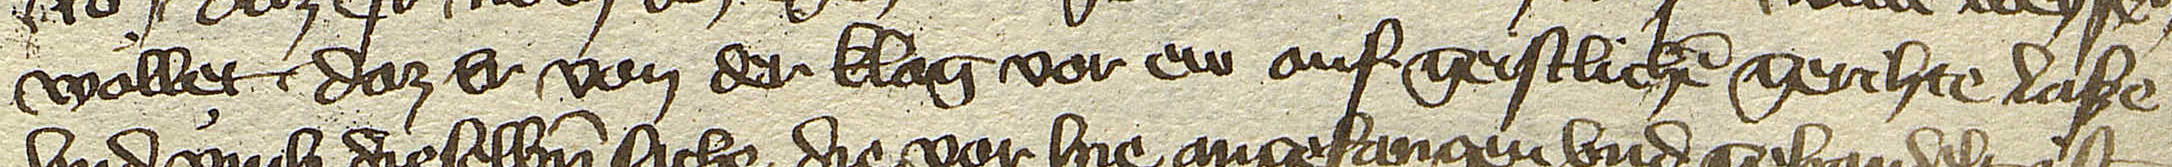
wöllet / daʒ Er von der klag vor ew auf geiſtliche* gerihte laſʒe
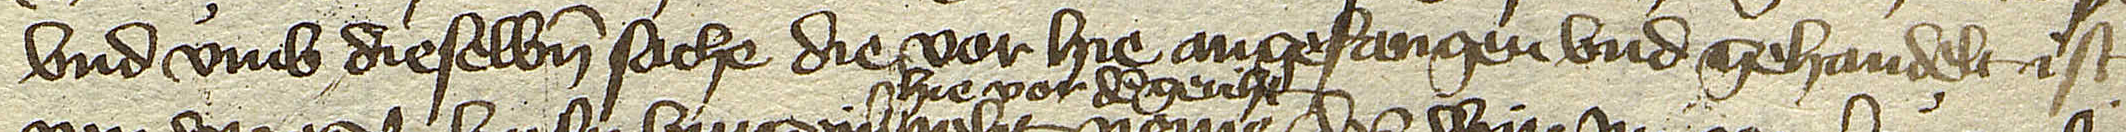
vnd v̈mb dieſelbn* ſache die vor hie angefangen vnd gehandelt iſt
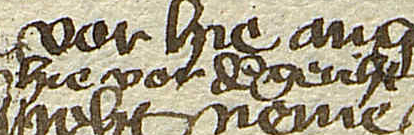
hie vor de* geriht
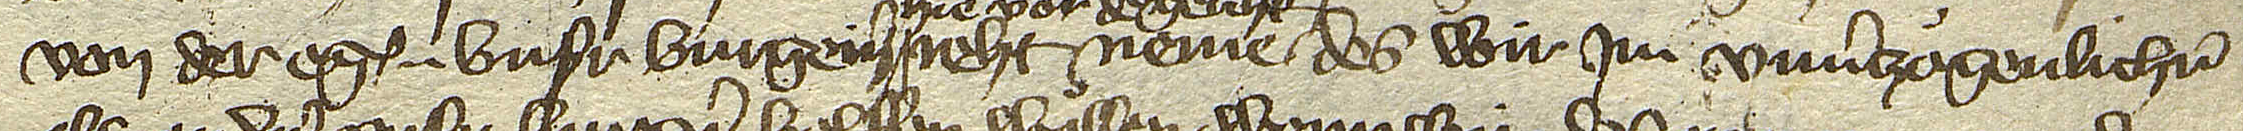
von der eg* ~ vnſ*r burgerin reht neme / des wir Im vnu*cʒögenlichn*
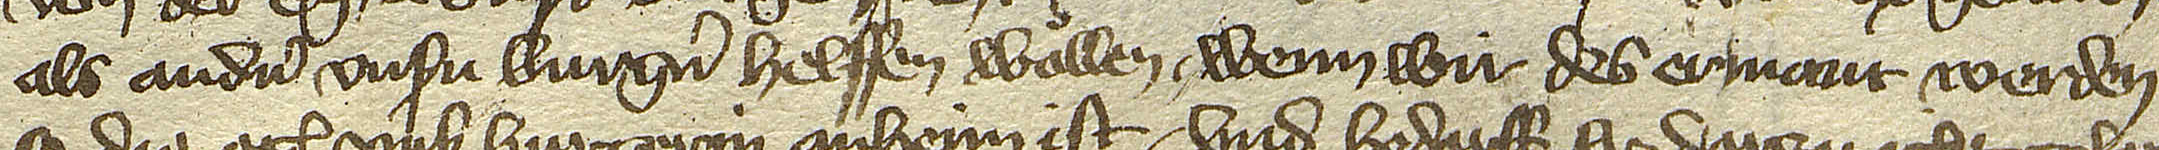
als andn* vnſ*n burgn* helffen wöllen / wenn wir des ermant werden
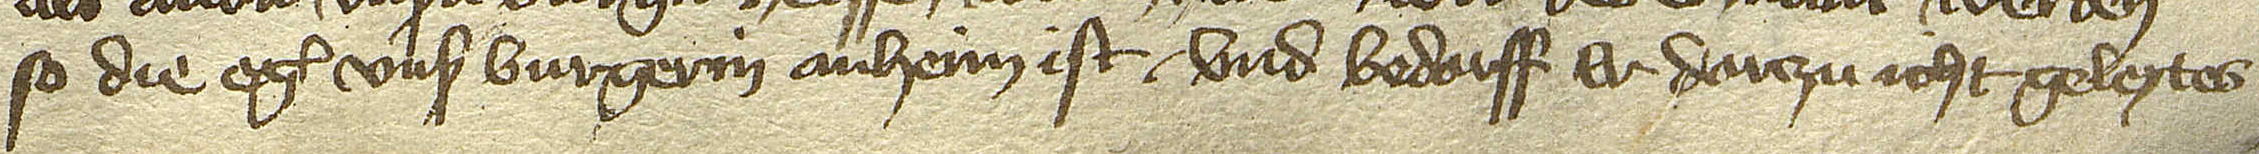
ſo die eg* vnſ* burgerin anheim iſt / vnd bedorff Er darcʒu icht geleytes
